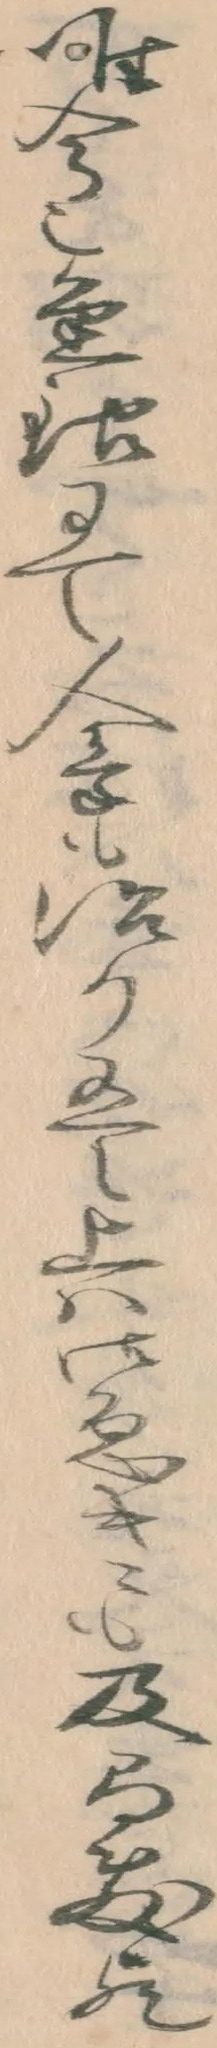唯今之金銀にて人気も治り有之上は御急きにも及間敷歟
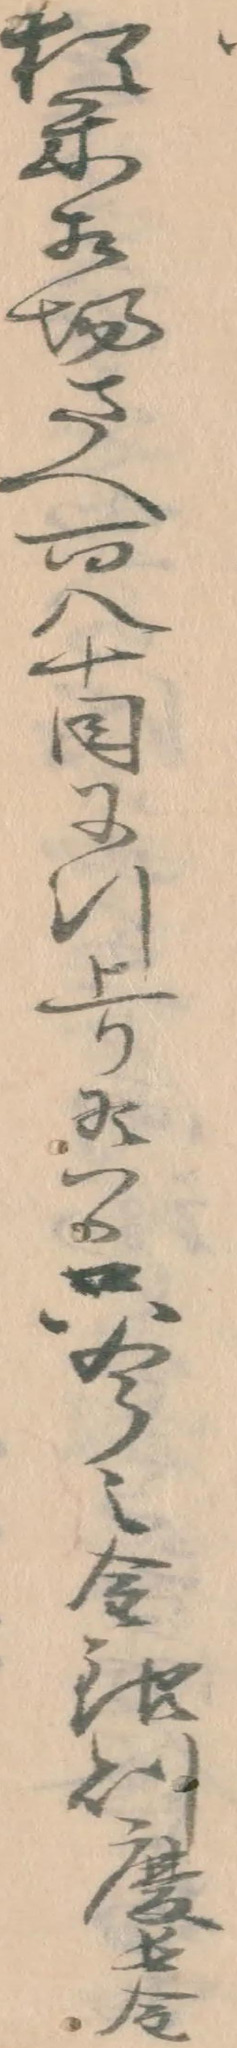猶米相場さへ百八十目に引上り候はゝ只今之金銀則慶長金
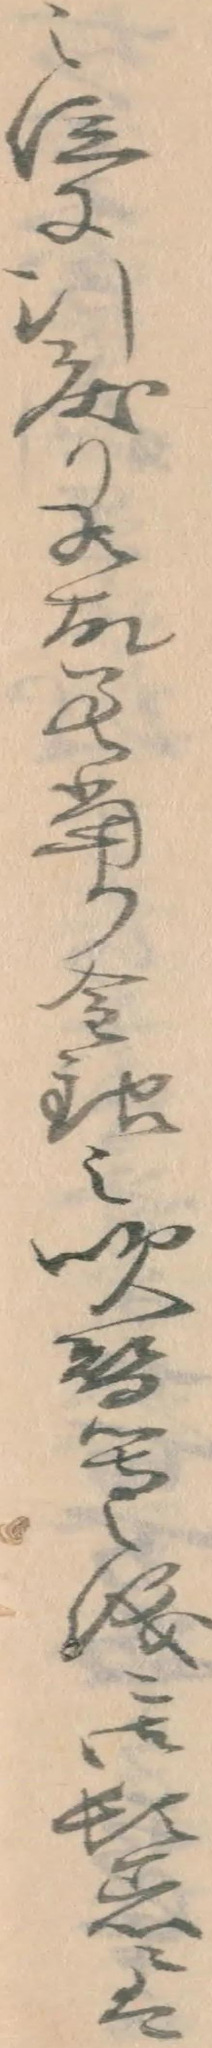之位に引戻り候故差当り金銀之吹替等之儀に御頓着には
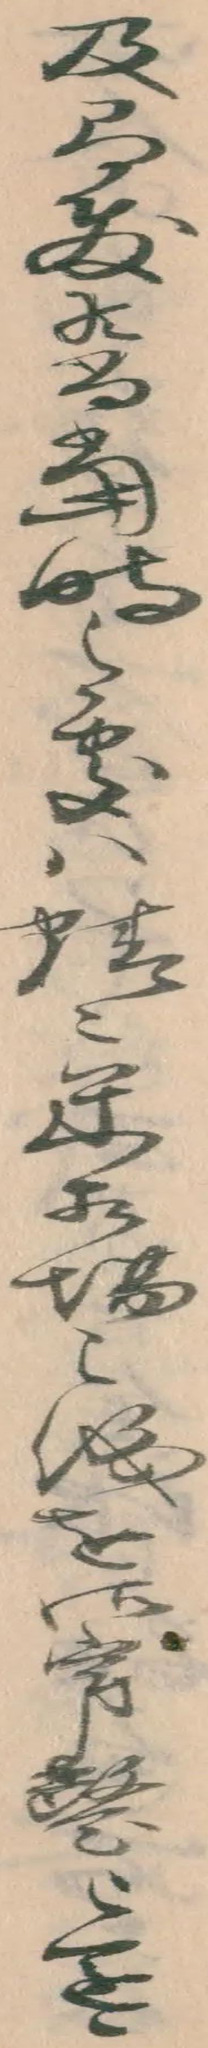及間敷候尚当時之処は精々米相場之儀を御穿鑿被遂候
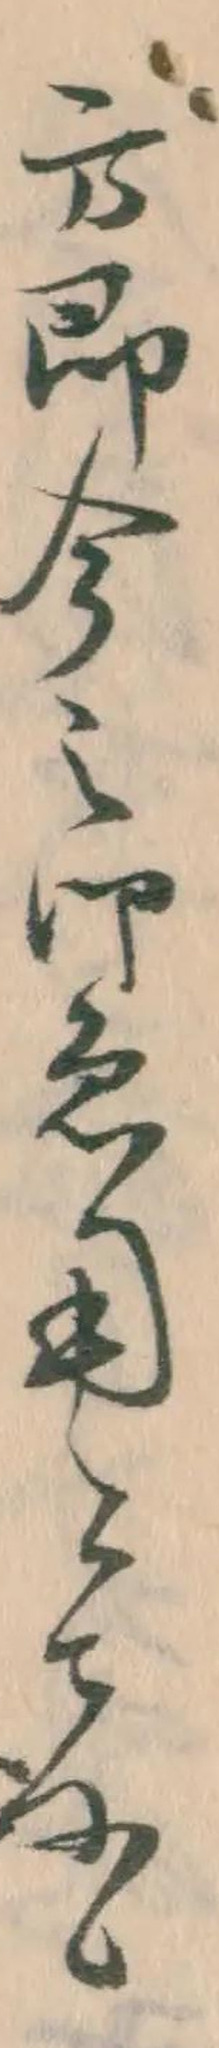方即今之御急用とて存候
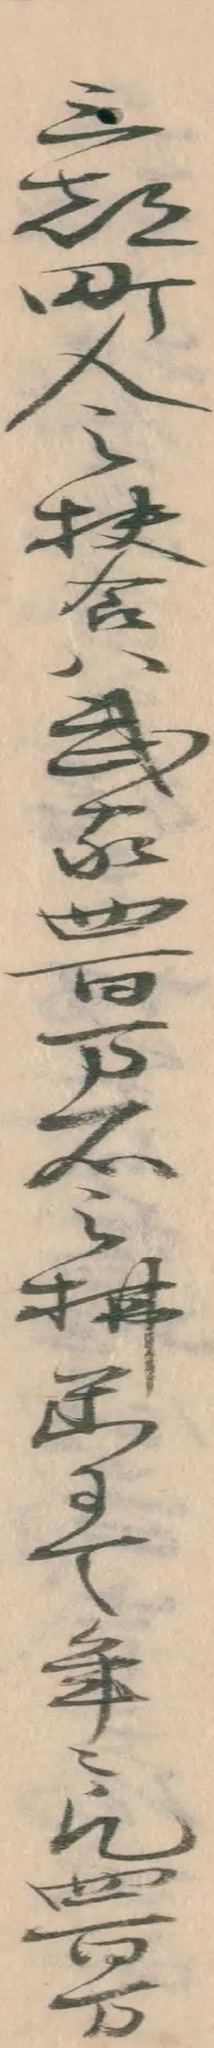一三都町人之扶食は武家四百万石之払米にて年々凡四百万
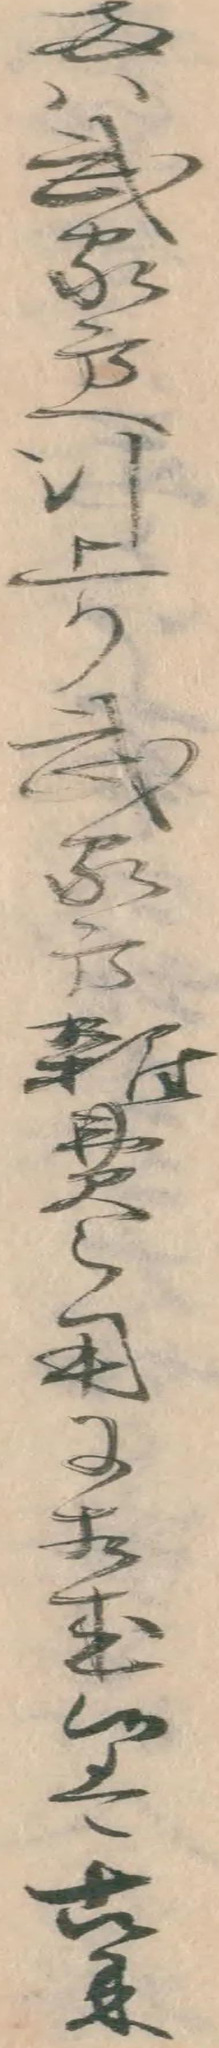両は武家方へ引上り武家方雑費之用に相成候は古来
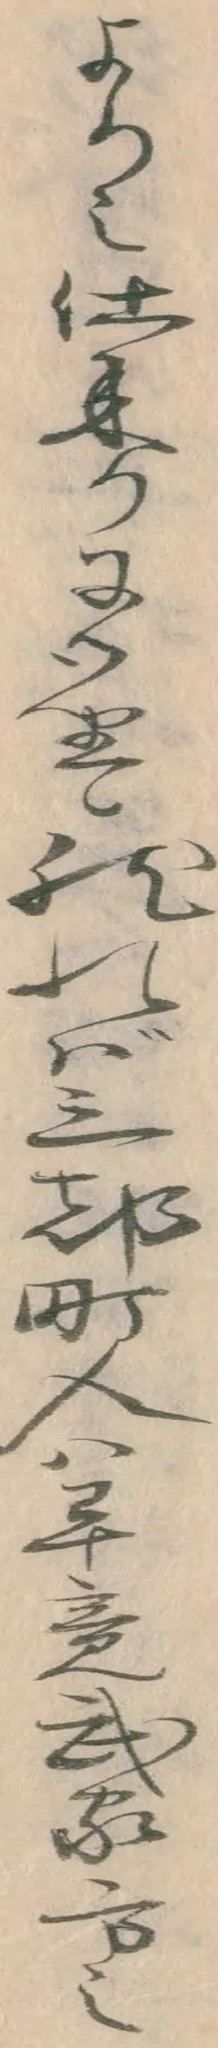より之仕来りに御坐候然れば三都町人は畢竟武家方之
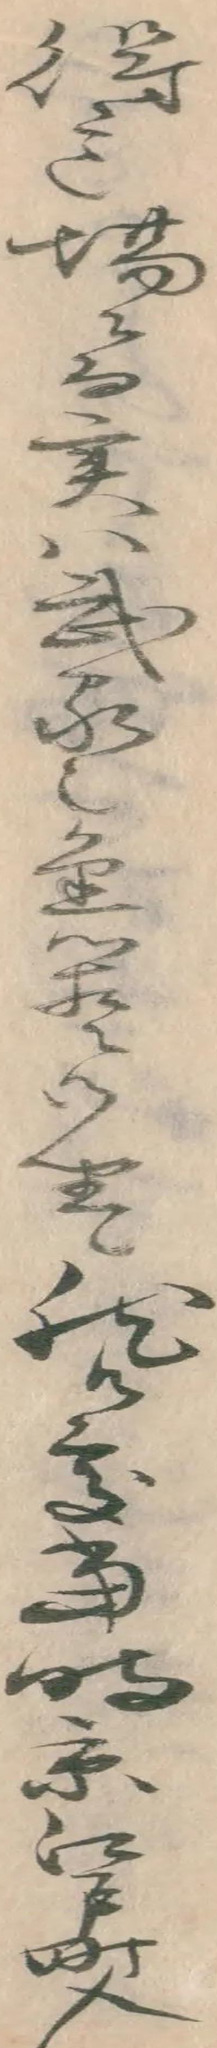得々之場に而実は武家之金箱に御坐候然る処当時京江戸町入
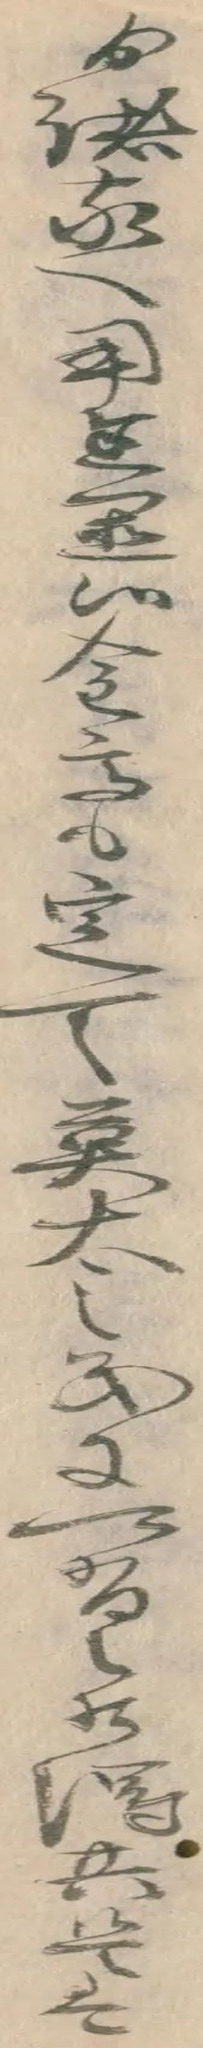ゟ諸家へ用達置候金高も定て莫太之義に可有之候得共是は
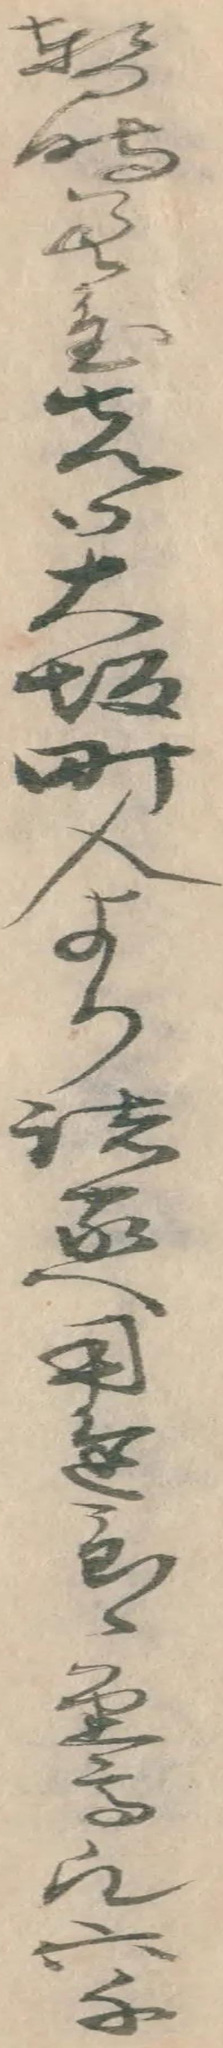暫時差置先つ大坂町人より諸家へ用達置候金高凡六千
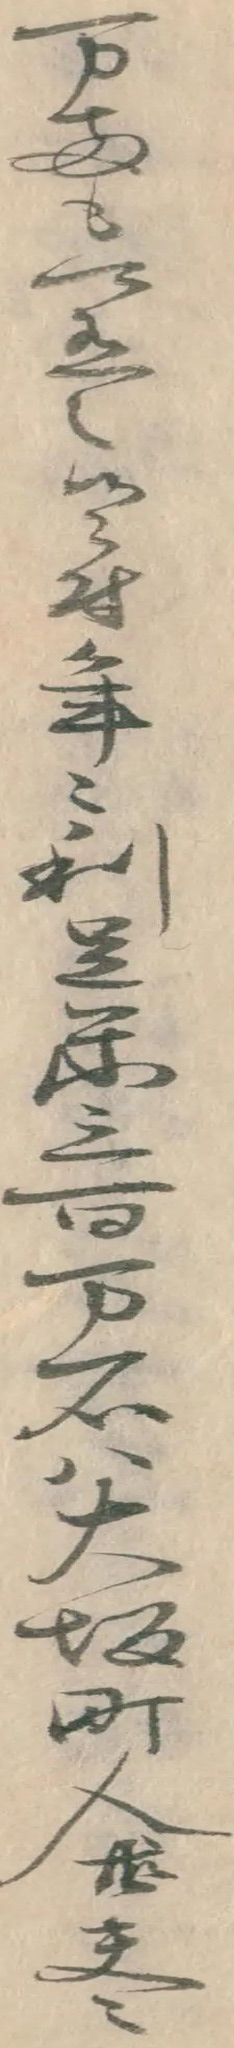万両も可有之候に付年々利足米三百万石は大坂町人共夫々
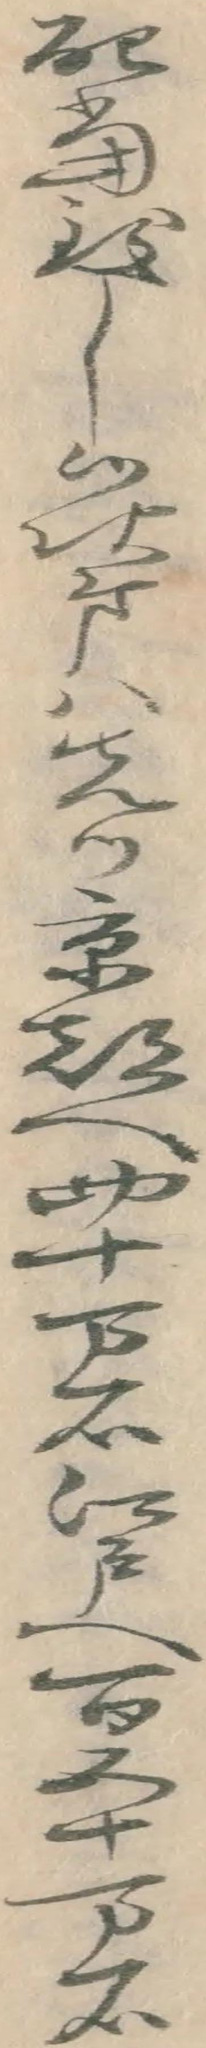配当致し候次第は先つ京都へ四十万石江戸へ百五十万石

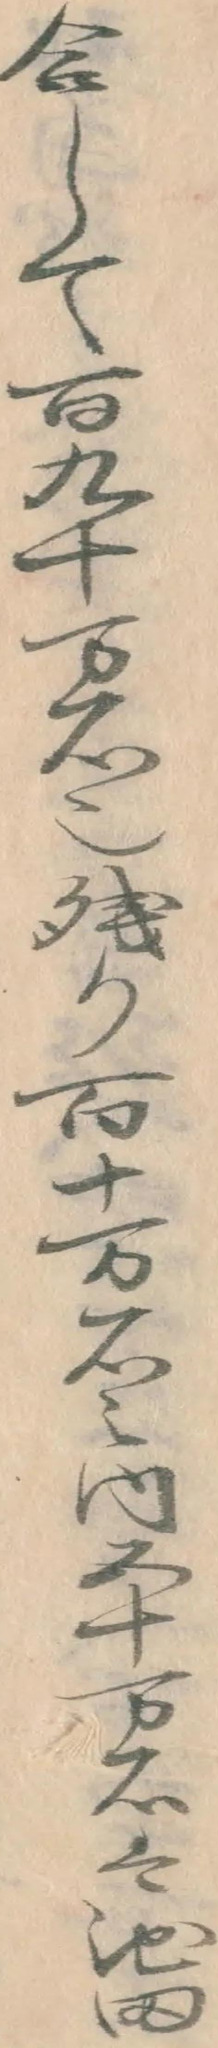合して百九十万石也残り百十万石之内五十万石は池田
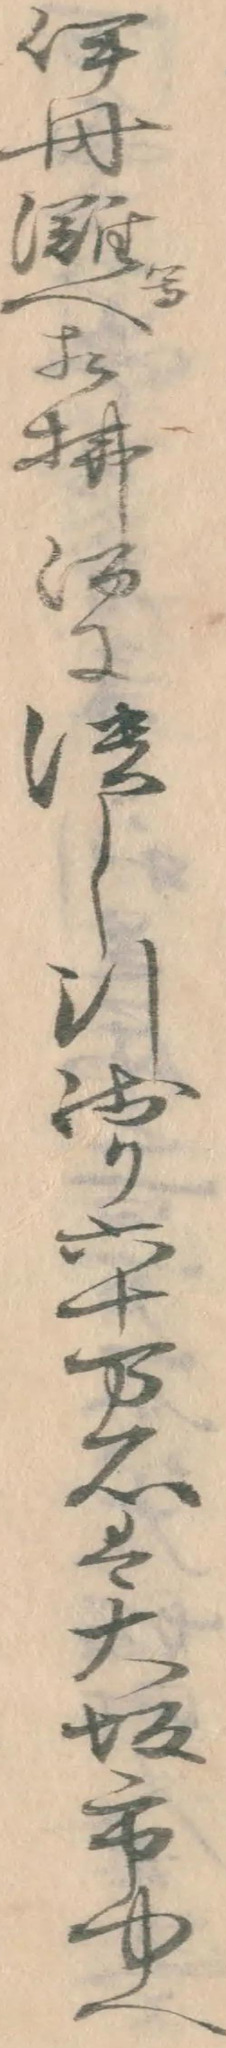伊丹灘等へ相払酒に潰し引残り六十万石は大坂市中へ
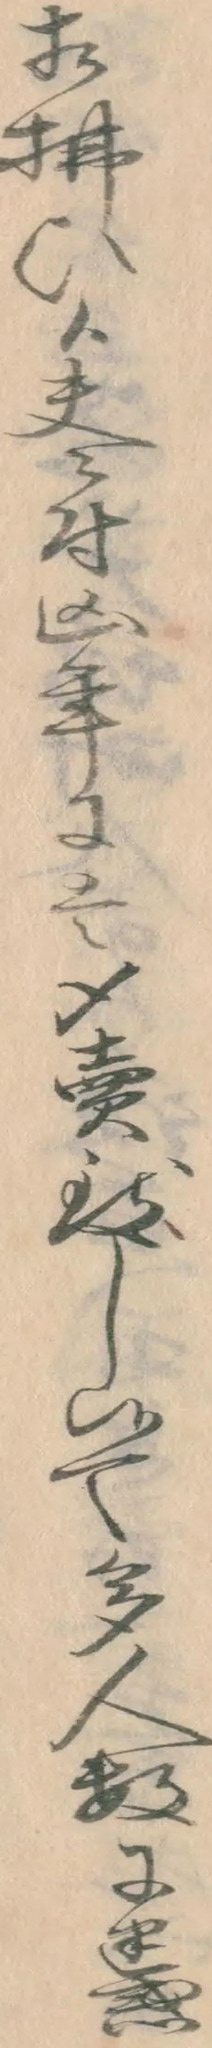相払ひ候夫に付凶年には〆売致し候て多人数に迷惑
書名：斎庭之穂
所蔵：国立国会図書館 National Diet Library, JAPAN
